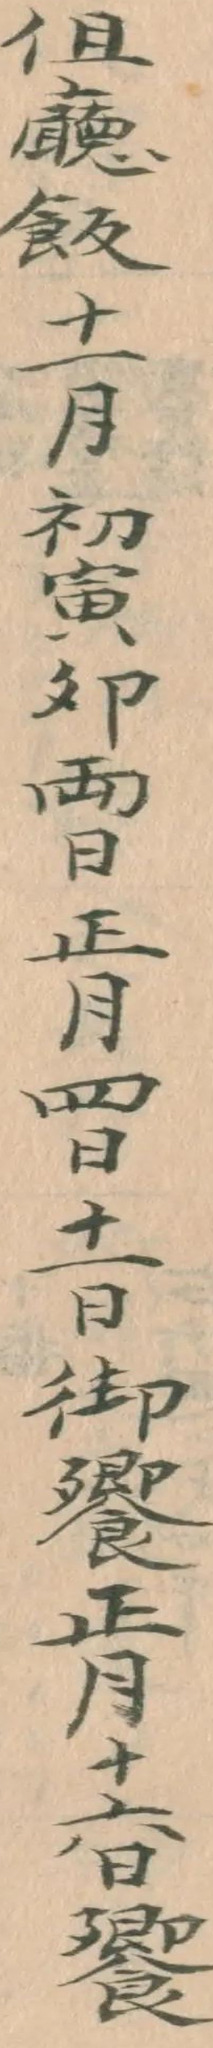但廳飯十一月初寅卯両日正月四日十一日御饗正月十六日饗
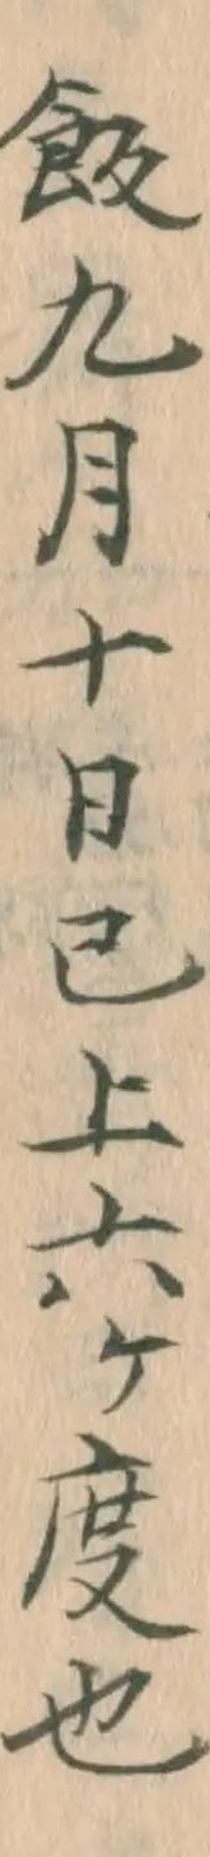飯九月十日已上六ケ度也
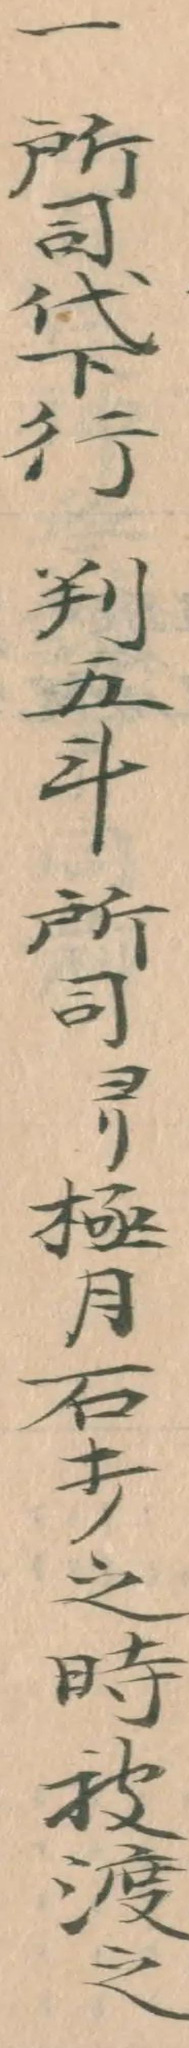所司代下行判五斗所司ヨリ極月石打之時被渡之
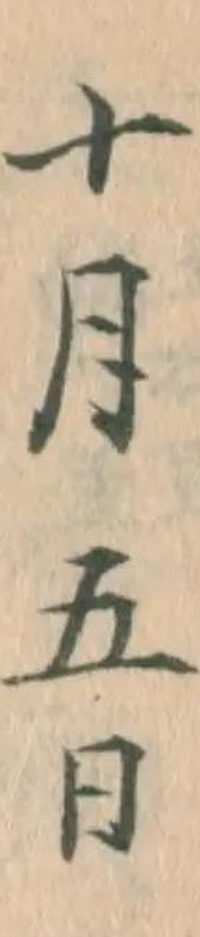十月五日
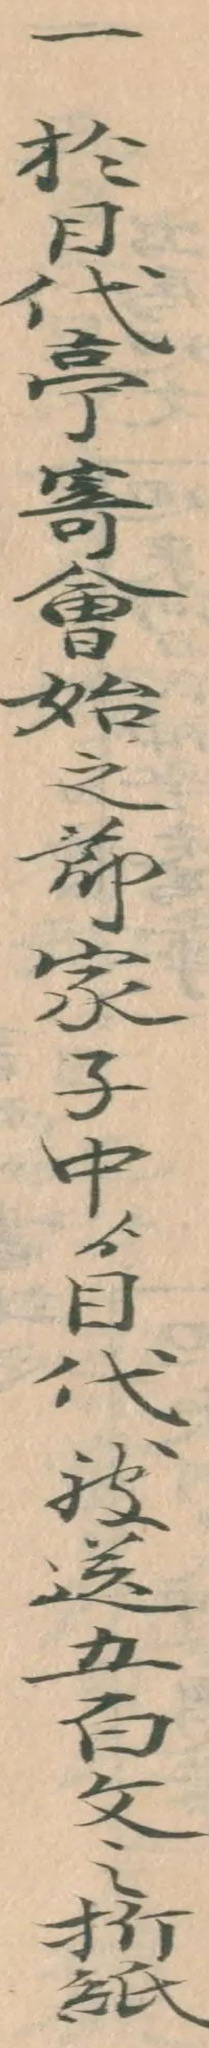一於目代亭寄會始之節家子中ゟ目代ヘ被送五百文之折紙
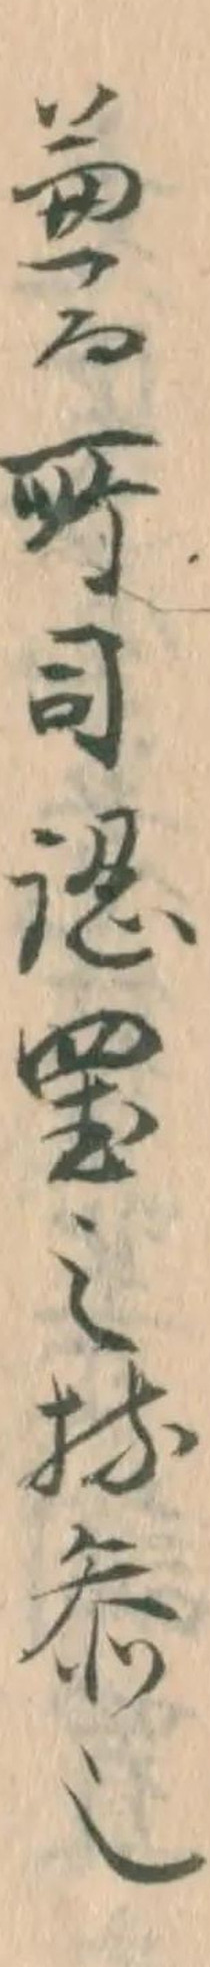兼而所司認置之持参也
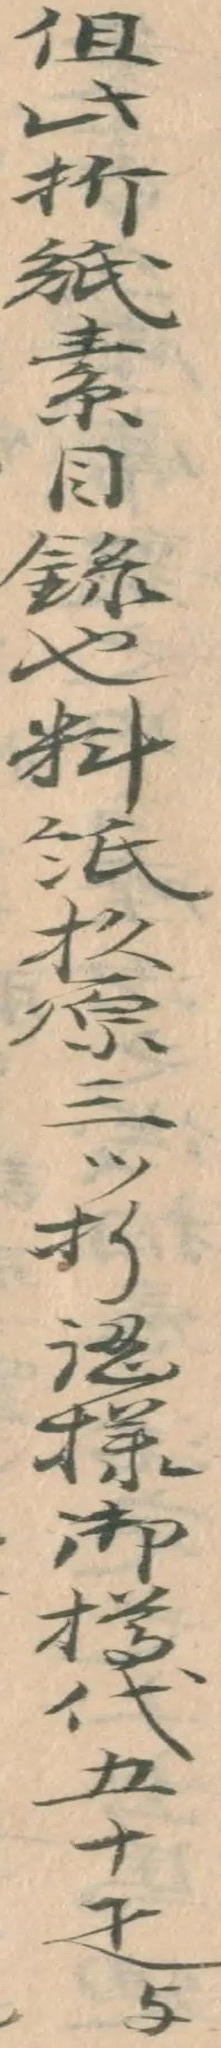但此折紙素目録也料紙杦原三ツ折認様御樽代五十疋と
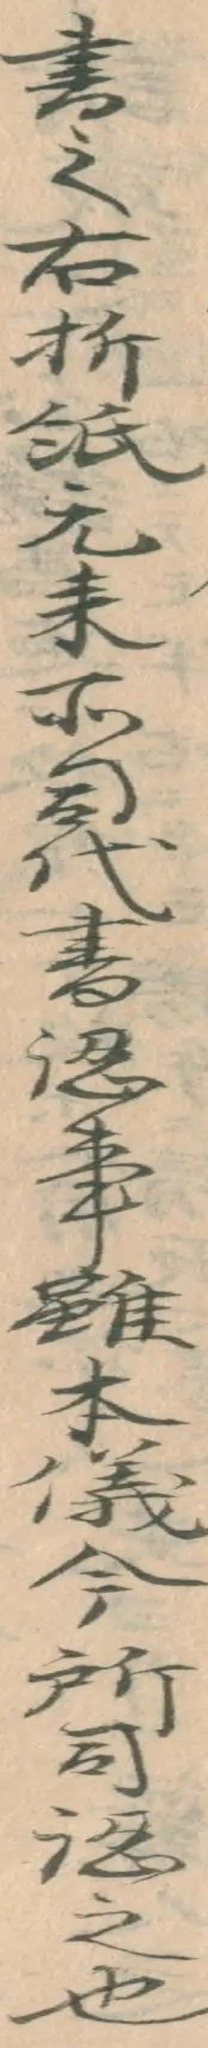書之右折紙元来所司代書認事雖本儀今所司認之也

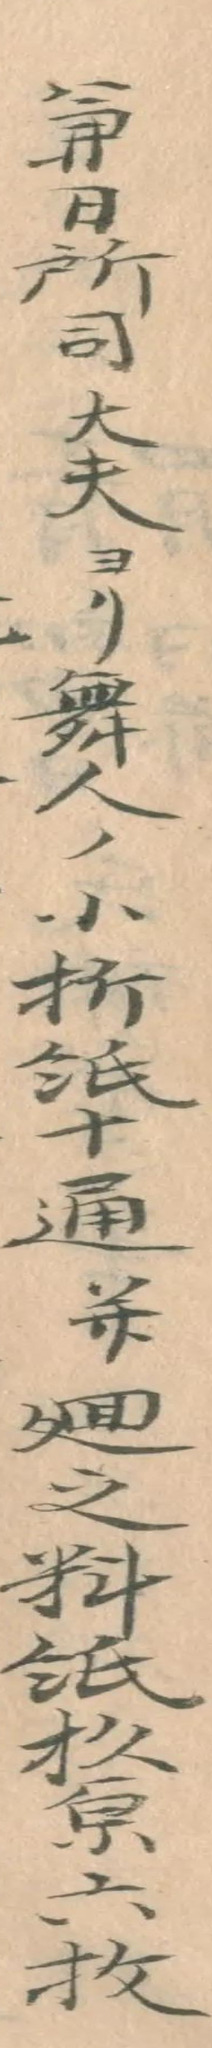一兼日所司大夫ヨリ舞人ノ小折紙十通并廻之料紙杦原六枚
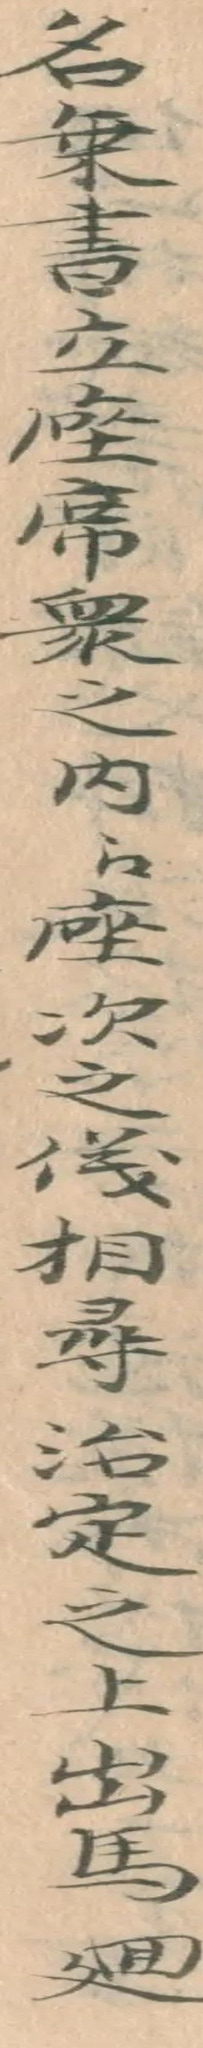名乗書立座席衆之内え座次之儀相尋治定之上出馬廻
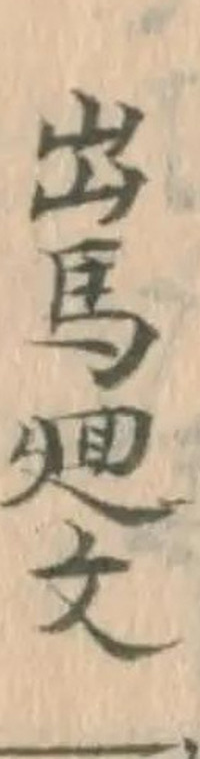出馬廻文
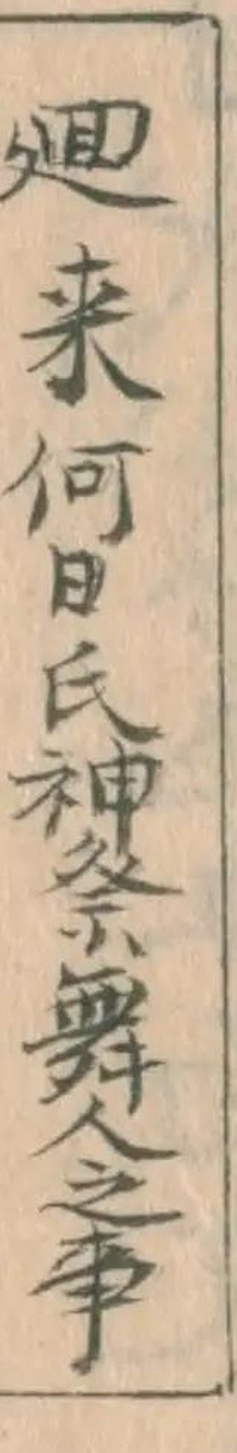廻来何日氏神祭舞人之事
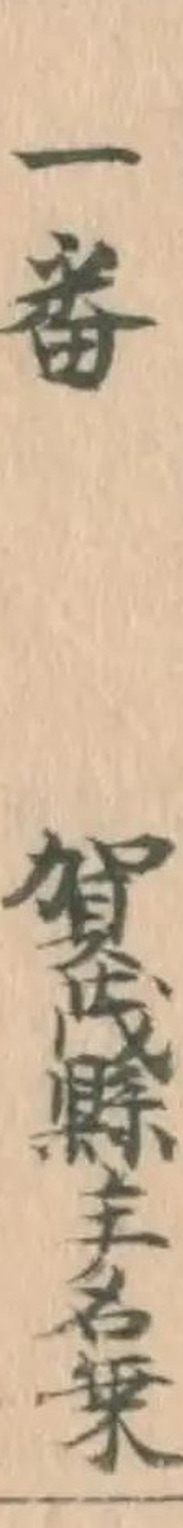一番賀茂縣主名字
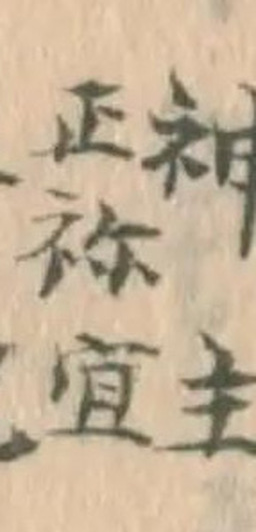正弥宜
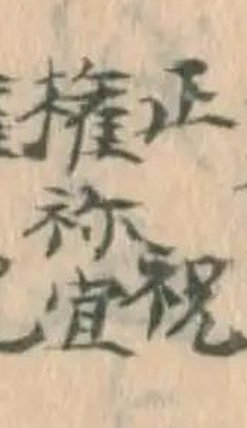権弥宜
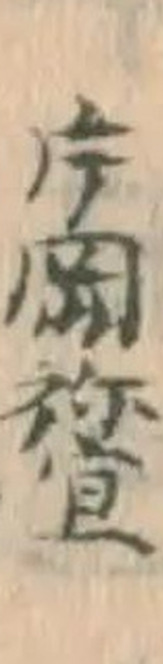片岡祝
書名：賀茂社記録. 第40冊
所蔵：国立国会図書館 National Diet Library, JAPAN
